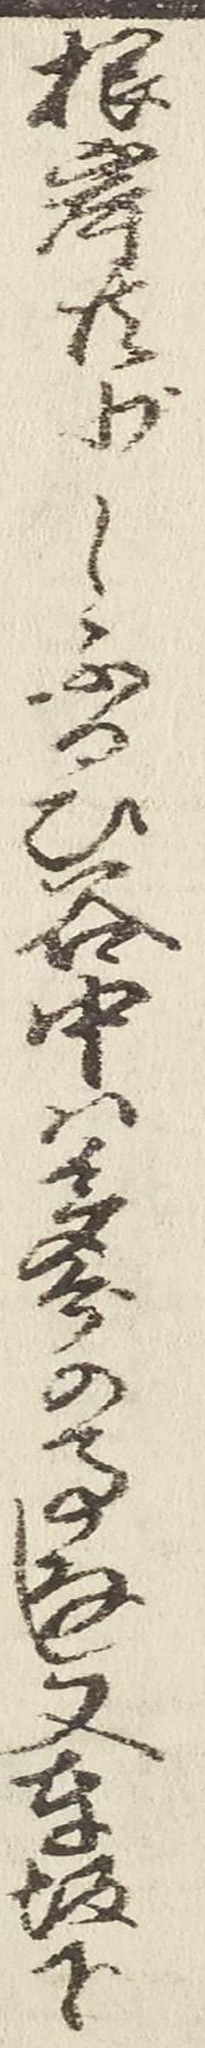根岸共少しふるひ谷中は多分の事なし又車坂下
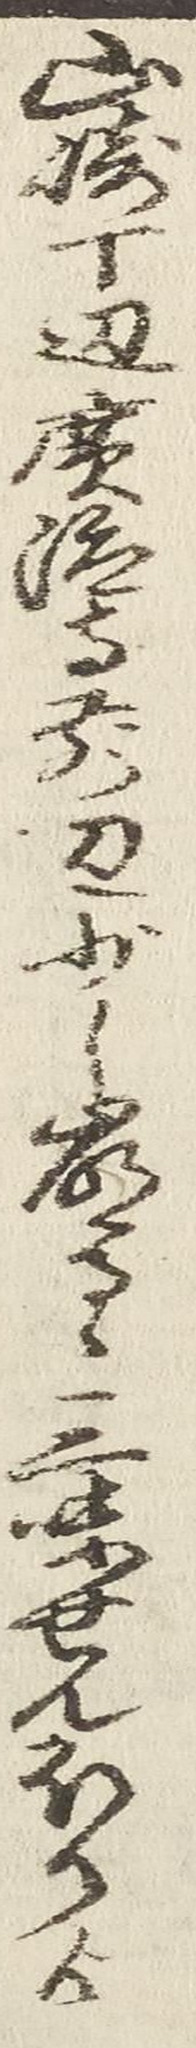山崎丁辺広徳寺前辺少し崩るゝ三味せんほりゟ
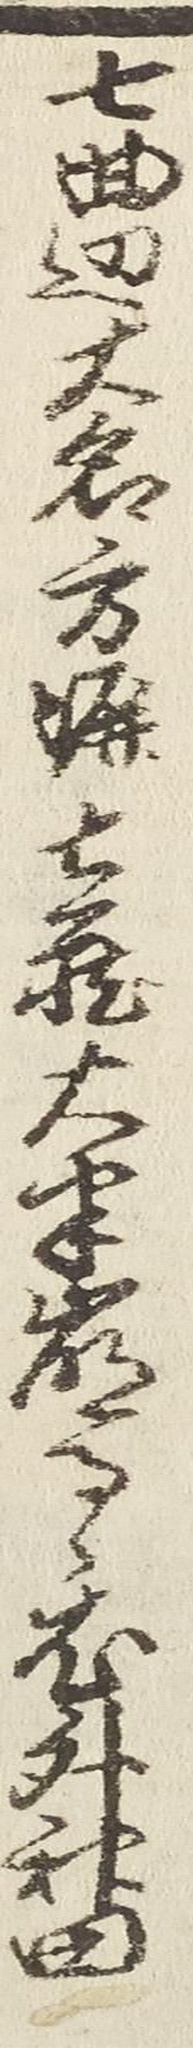七曲辺り大名方塀土蔵大半崩るゝ尤外神田
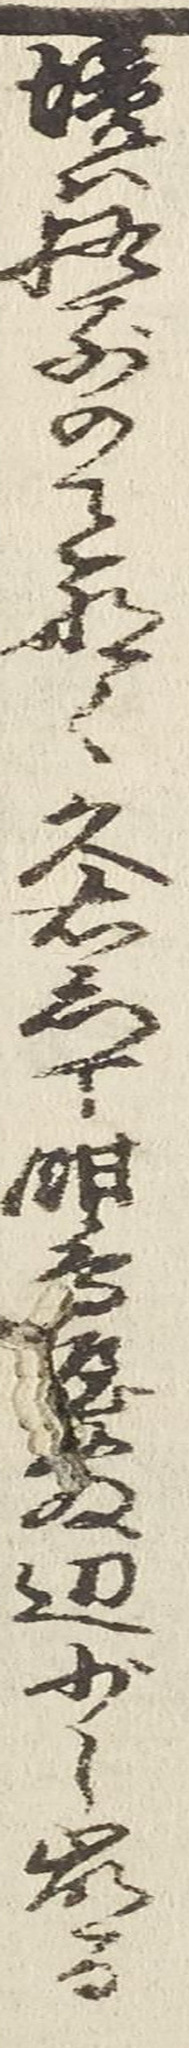境は格別のことなく久右衛門丁飼鳥屋敷辺少し崩る

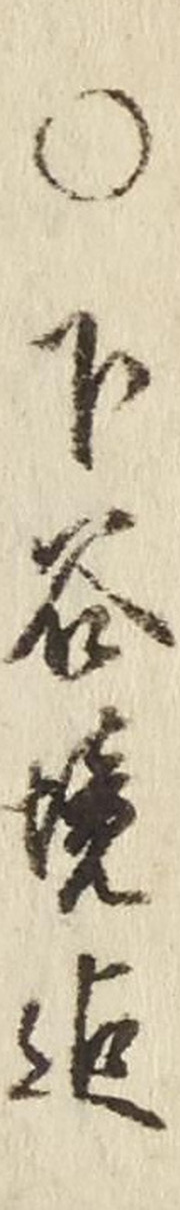○下谷境迄
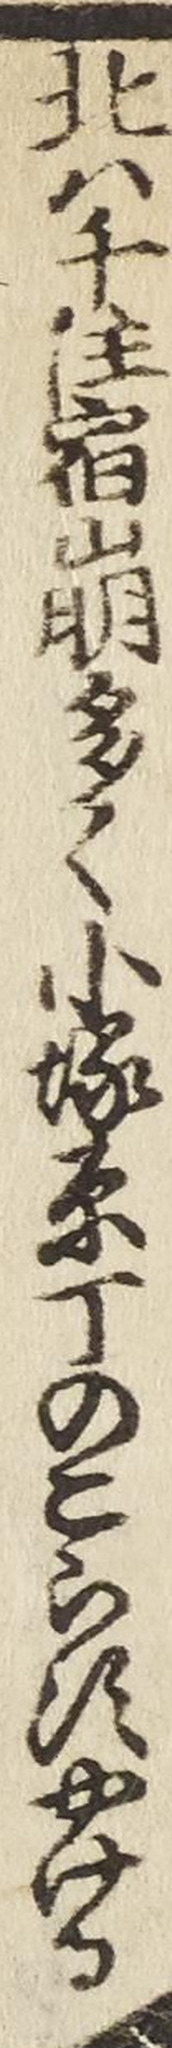北は千住宿崩多く小塚原丁のこらすやける
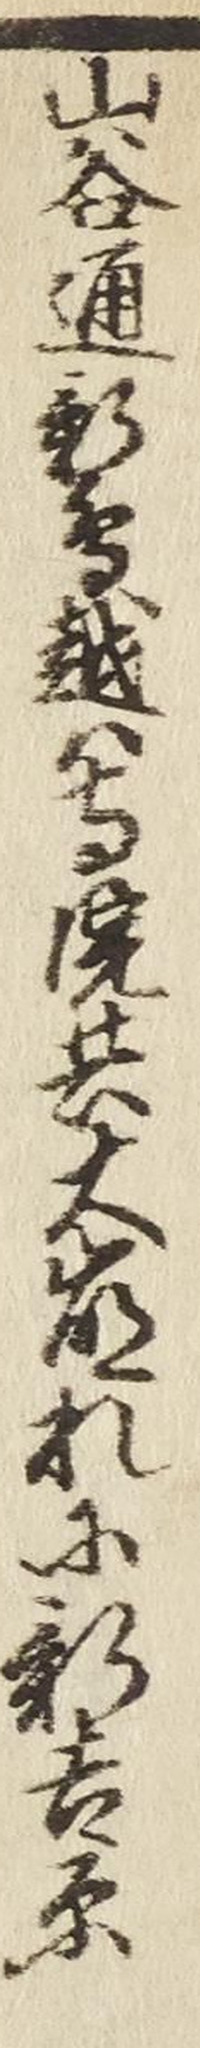山谷通新鳥越は寺院共大崩れに新吉原
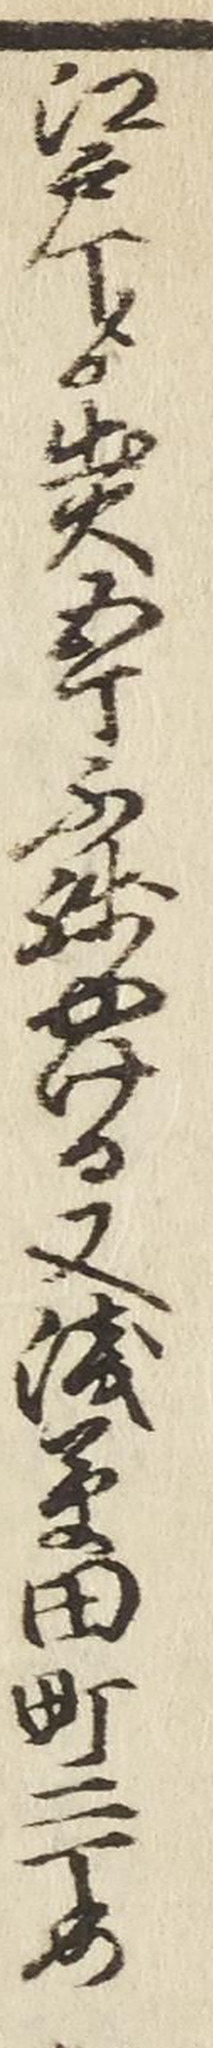江戸丁ゟ出火五丁不残やける又浅草田町二丁め
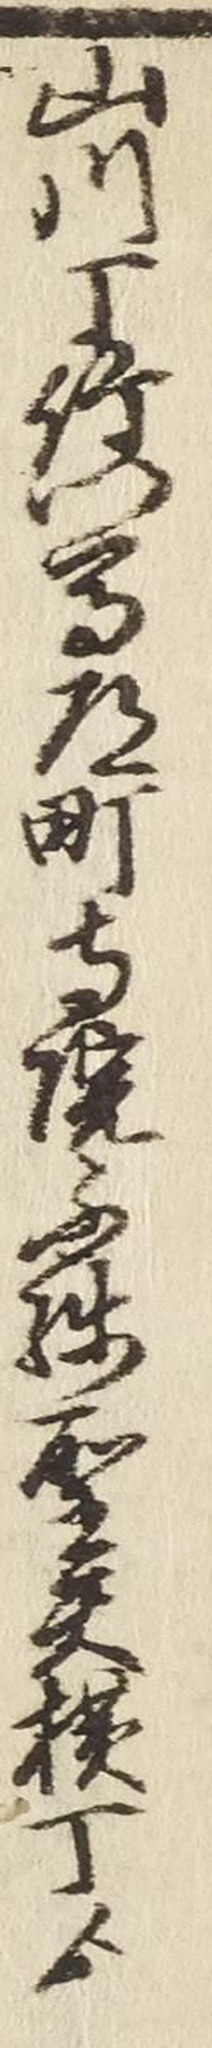山川丁竹門馬道町寺院不残聖天横丁ゟ
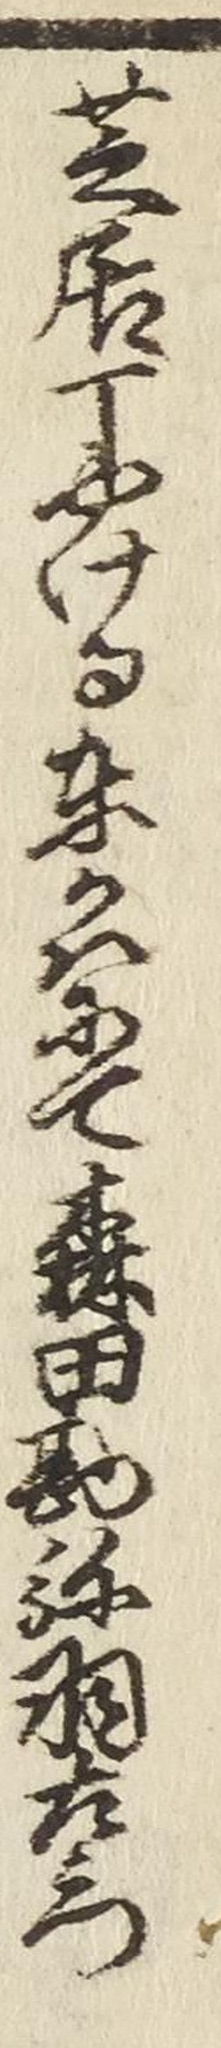芝居丁やける東かはにて森田勘弥羽左衛門
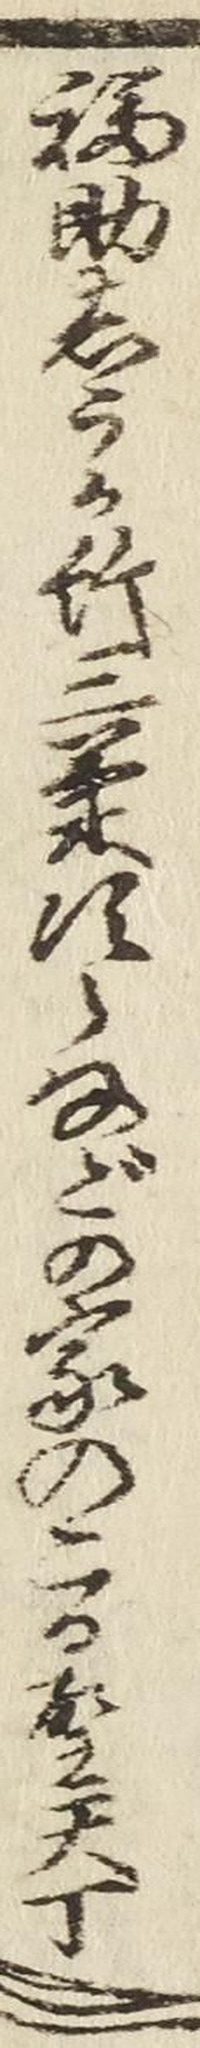福助しうか竹三菊次郎などの家のこる聖天丁
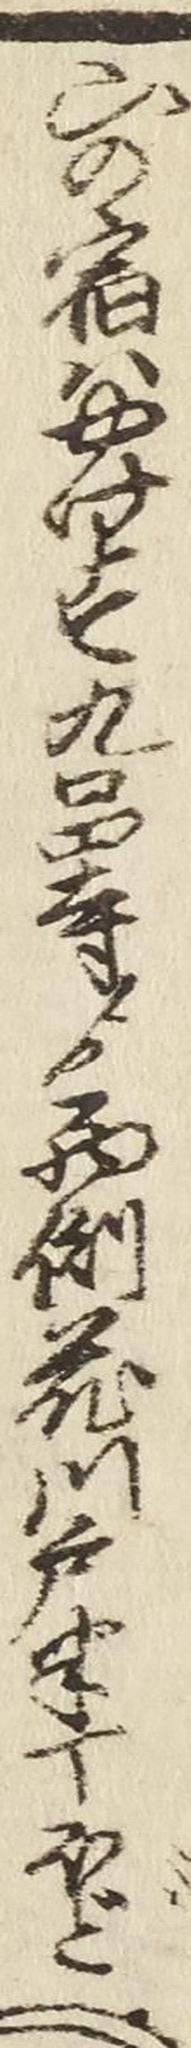山の宿はやけす九品寺ゟ西側花川戸半丁ほど
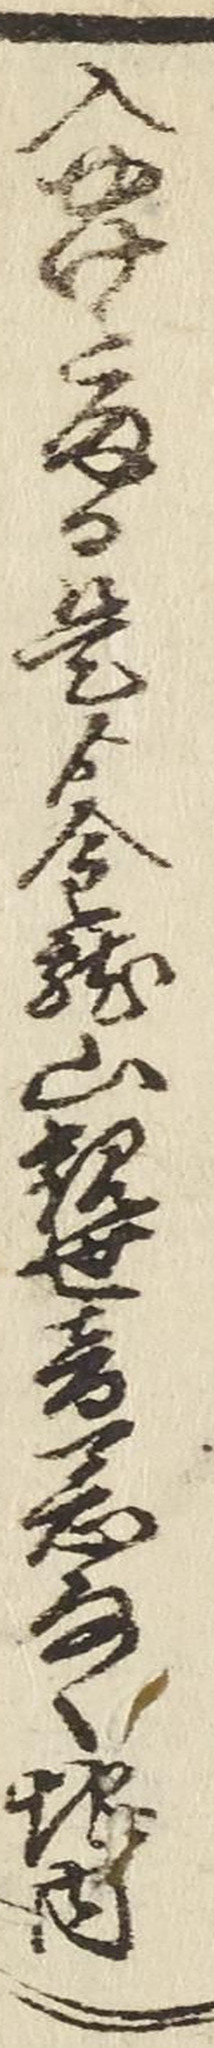入やけとまる是ゟ金龍山観世音恙なく地内
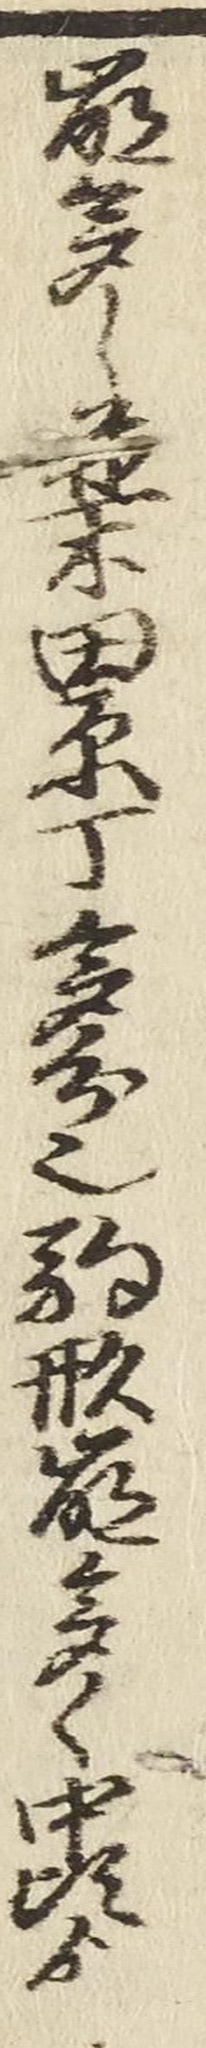崩多し並木田原丁多分也駒形崩多く中頃ゟ
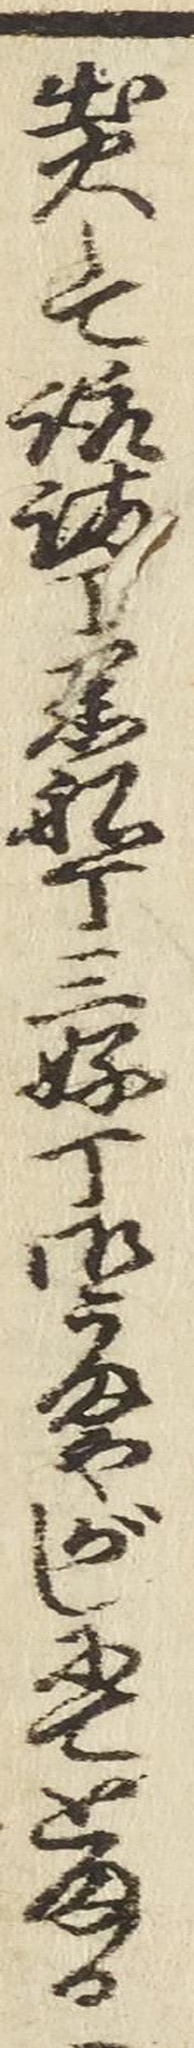出火して諏訪丁黒船丁三好丁御うまやがしにてとまる
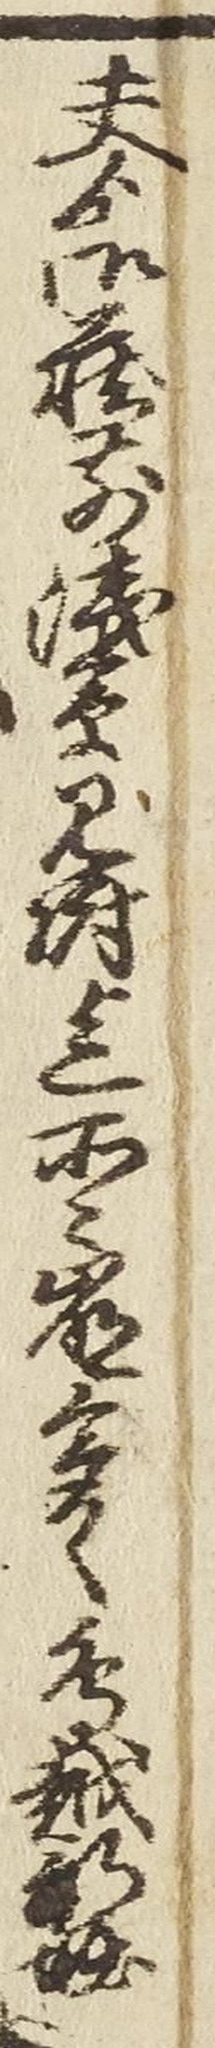夫ゟ御蔵前浅草見附迄所々崩多く鳥越新堀
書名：江戸みやげ
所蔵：東京大学地震研究所図書室 Earthquake Research Institute Library, The University of Tokyo, JAPAN
